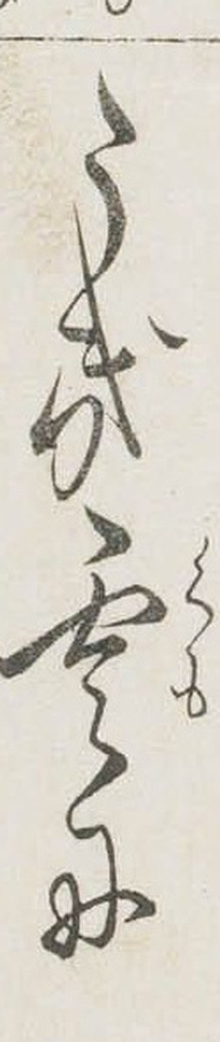うき雲に
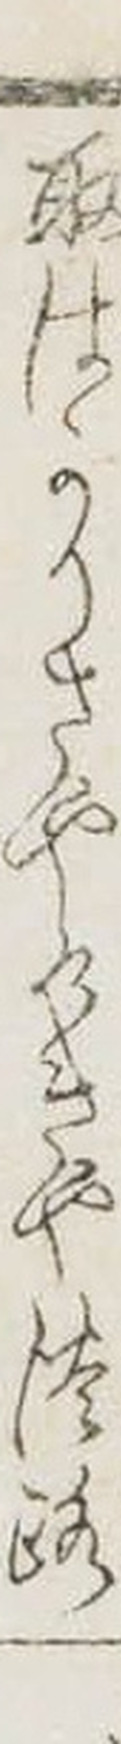取ばかりさやけきや淡路
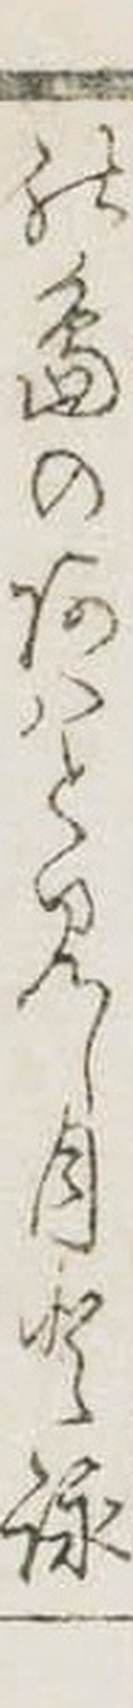の島のあはと見し月と詠
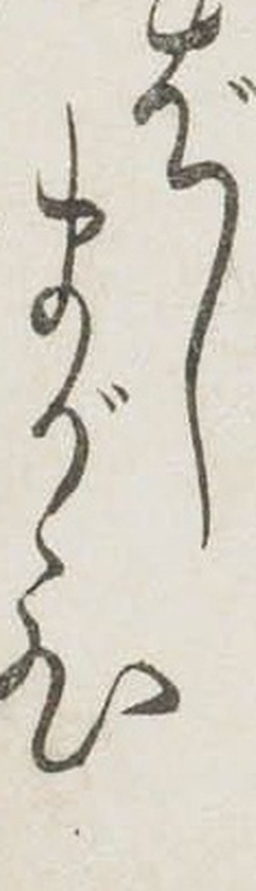まがひ
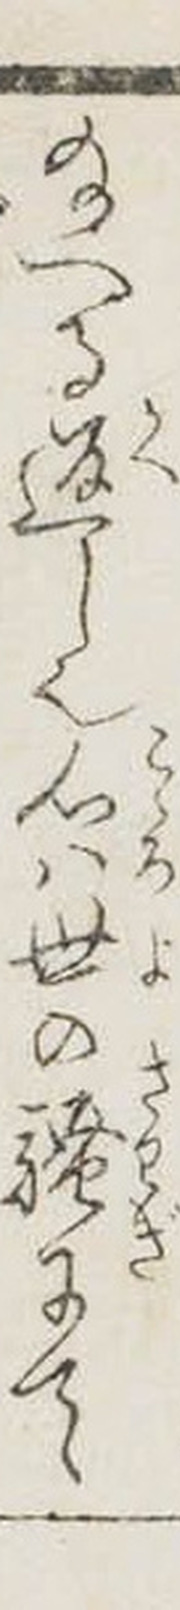給へる返し也心は世の騒にて
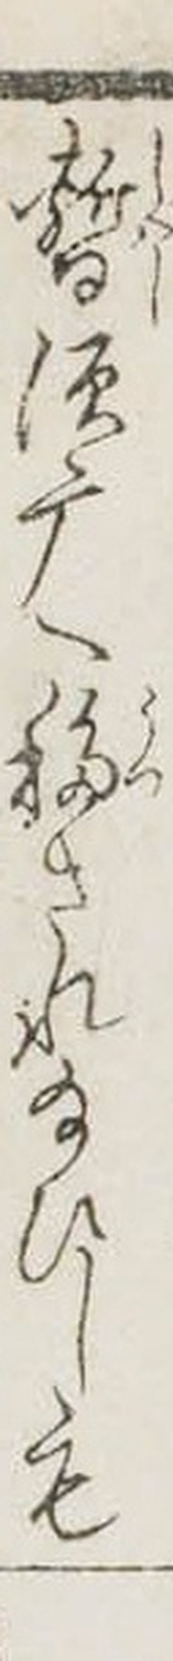暫須磨へ移され給ひしも
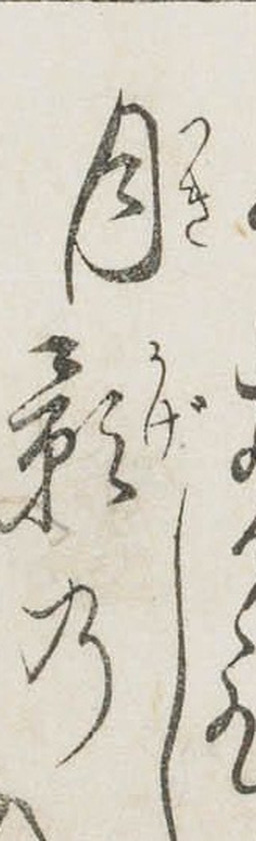月影の
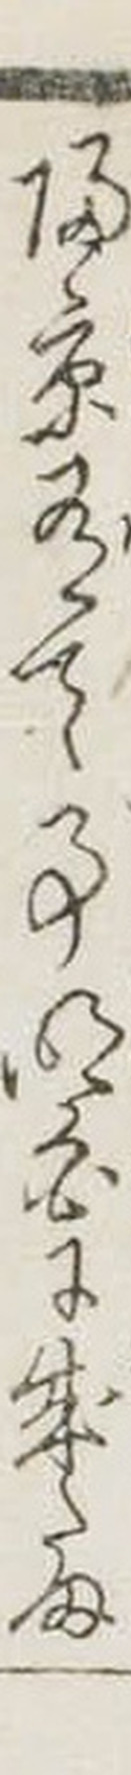帰京有て事明白に成たま
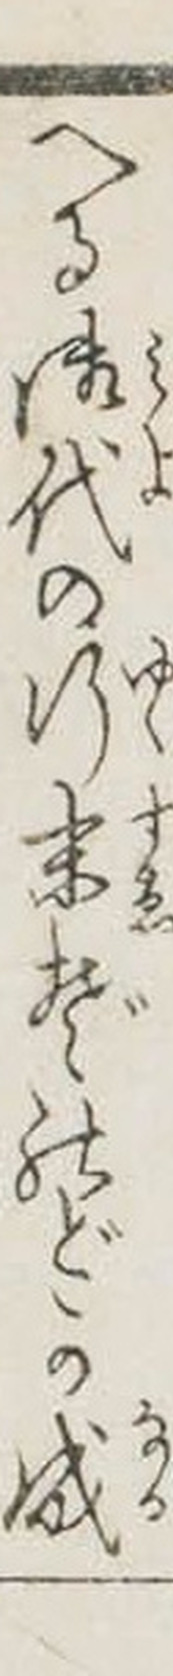へる御代の行末ぞのどか成
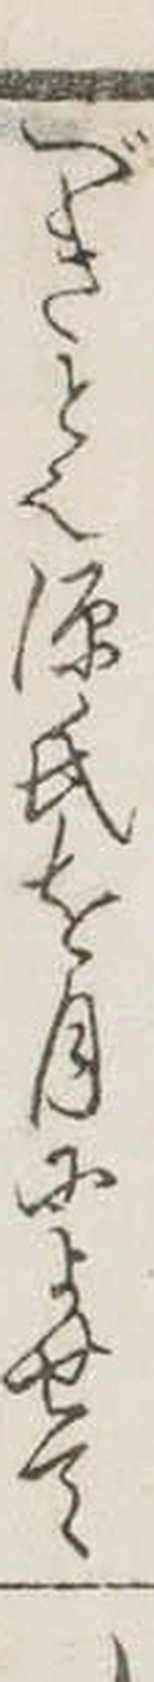べきと也源氏を月によせて
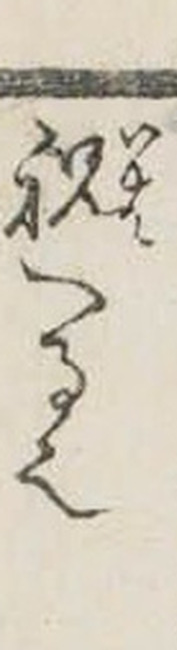祝へる也
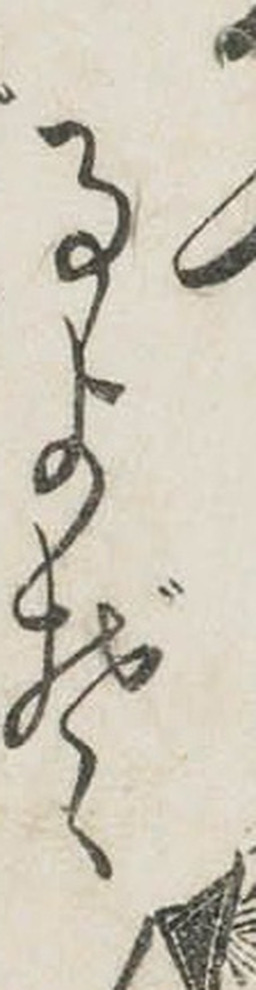るよぞ

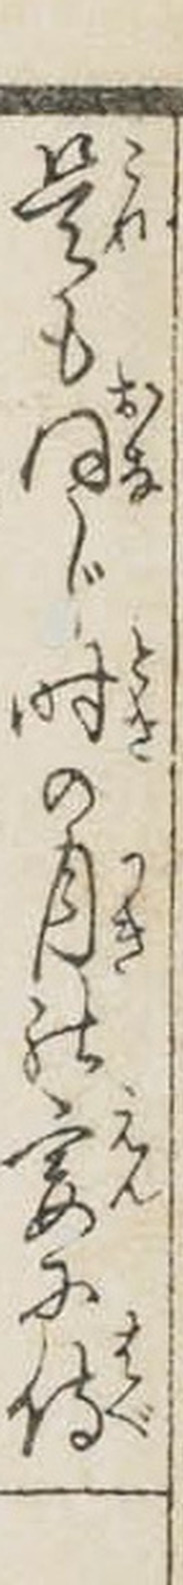是も同じ時の月の宴に侍
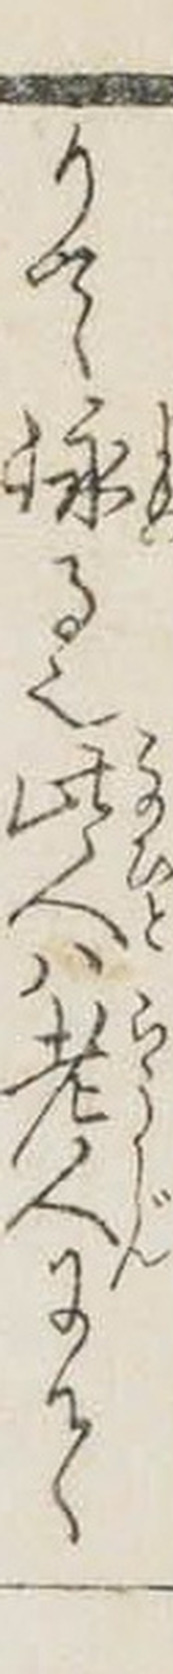りて詠る也此人は老人にて
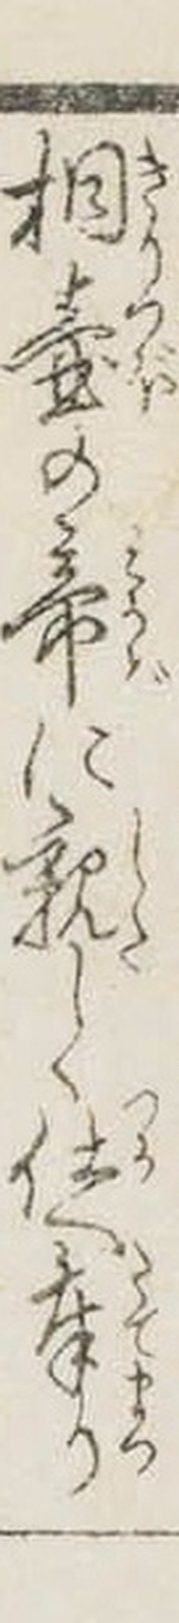桐壺の帝に親しく仕へ奉り
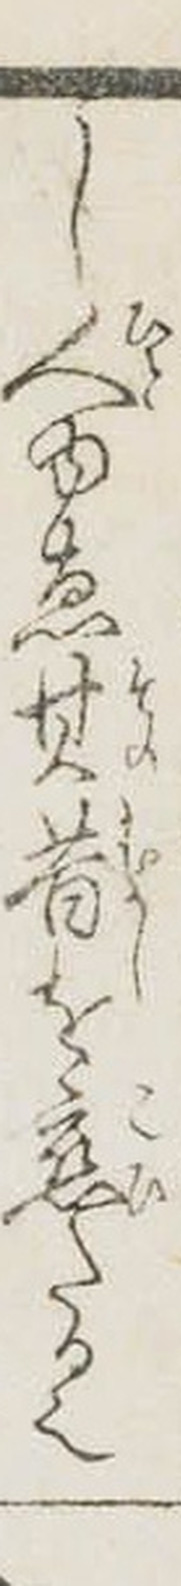し人ゆゑ其昔を恋たる也
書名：源氏百人一首
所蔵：東京学芸大学教育コンテンツアーカイブ
